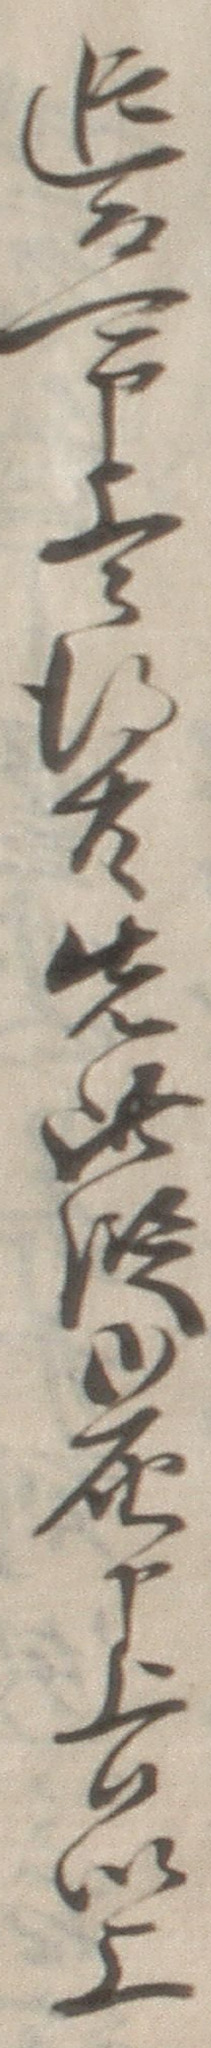追而可申上候得共先此段御届申上候以上
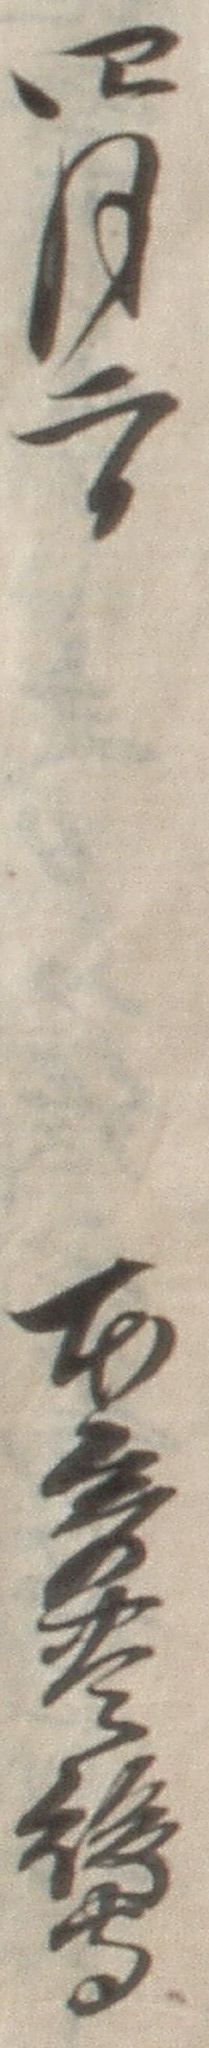四月二日本多豊後守
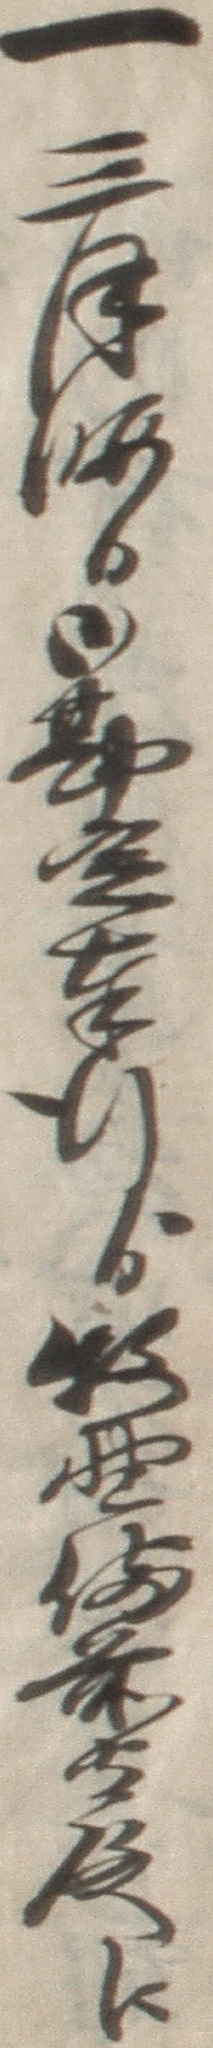一三月晦日御勘定奉行ゟ牧野備前守殿江
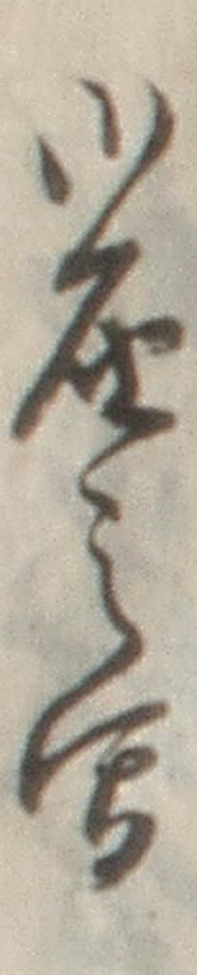御届之写

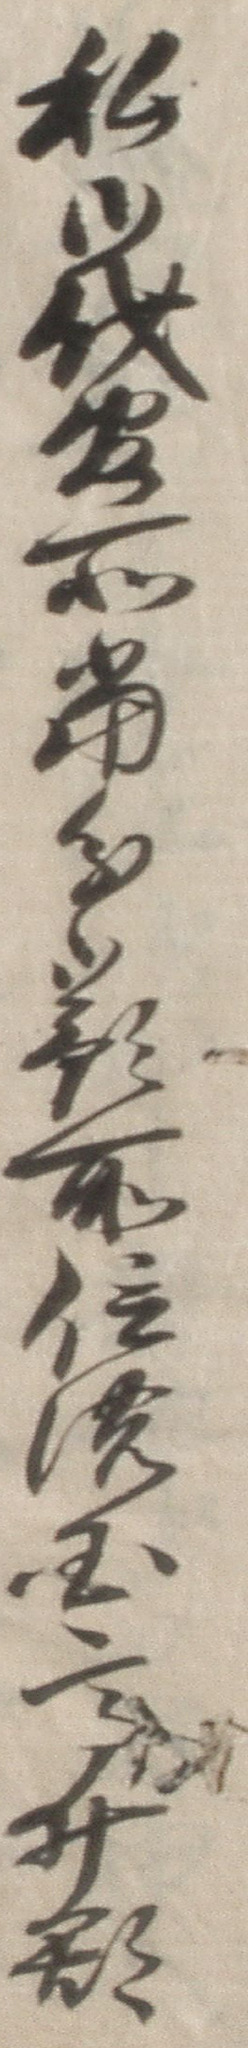私御代官所当分御預所信濃国高井郡
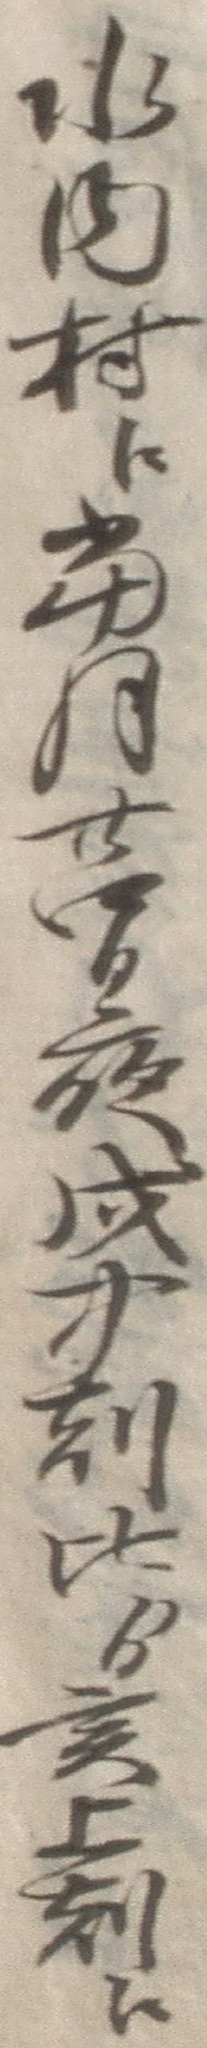水内村江当月廿四日夜戌中刻比ゟ亥上刻江
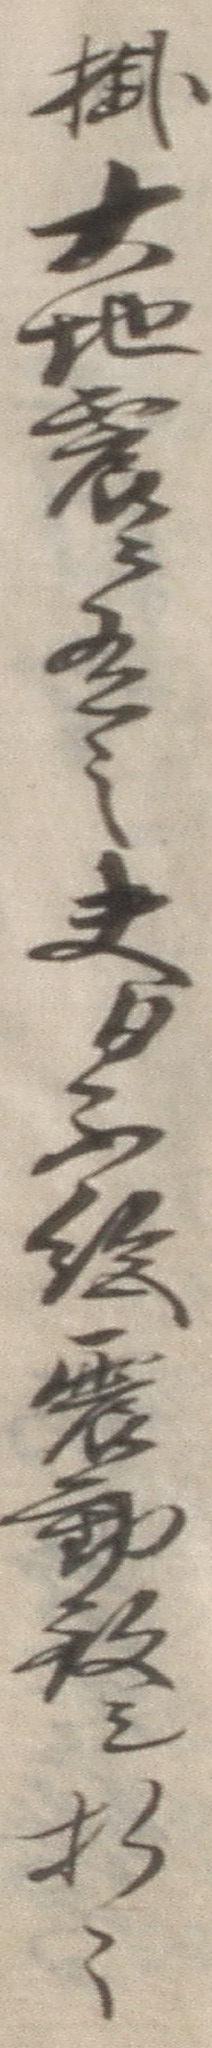掛大地震二有之夫ゟ不絶震動致ㇱ折々
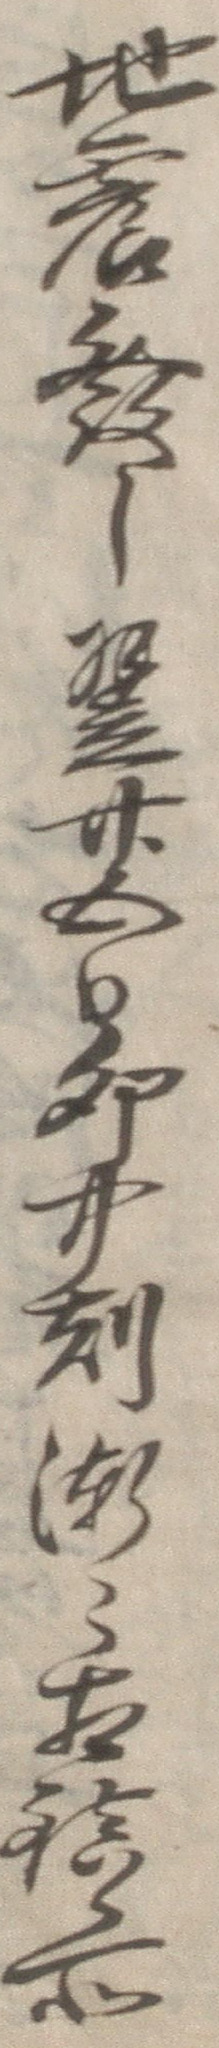地震発し翌廿五日卯中刻漸々相鎮候所
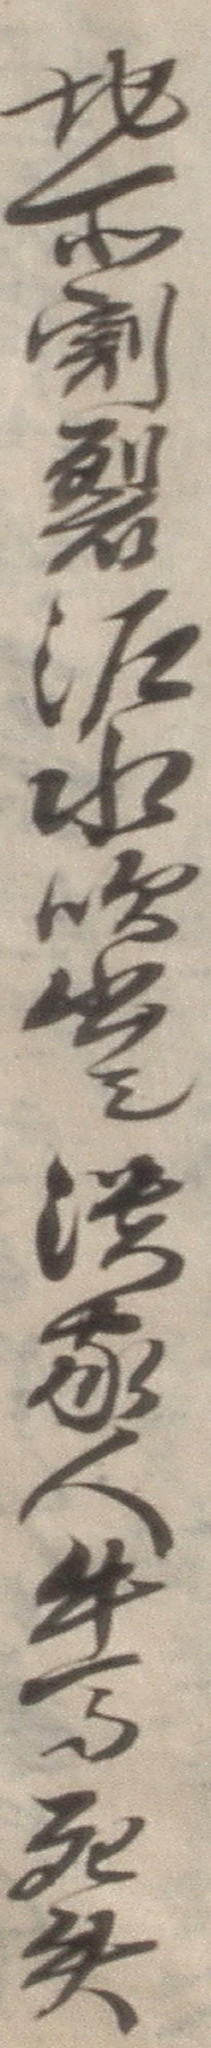地所割裂泥水吹出シ潰家人牛馬死失
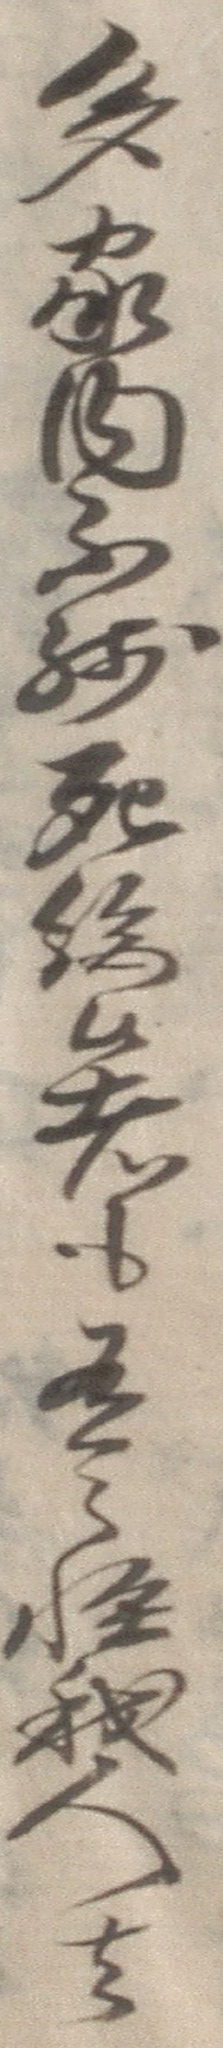多家内不残死絶候者も有候怪我人は
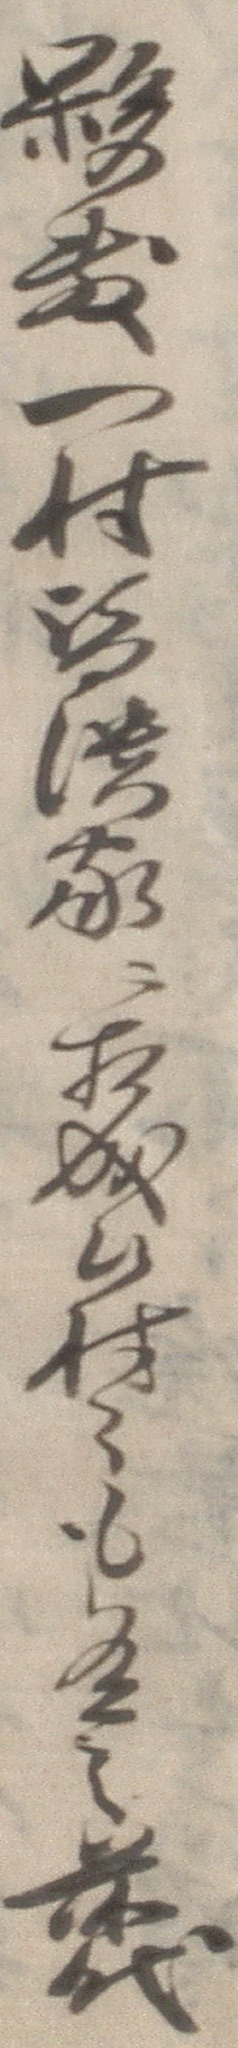夥敷一村皆潰家二相成候村々も有之前代
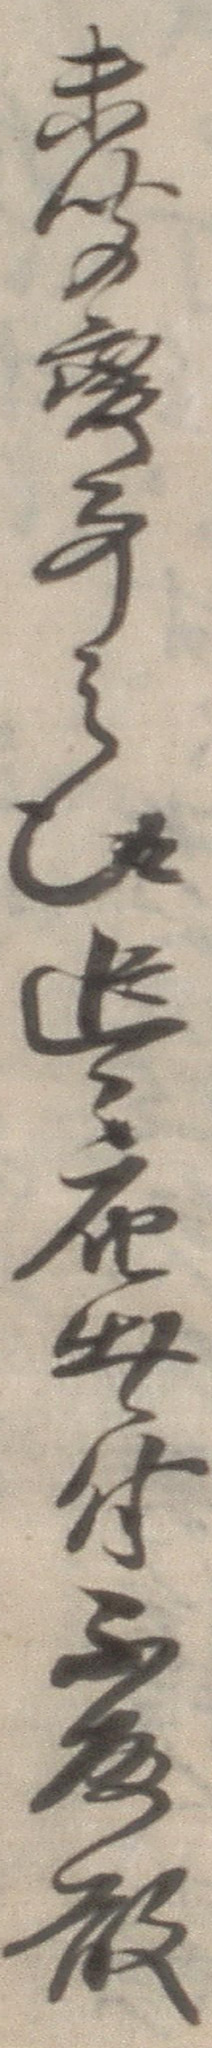未聞変事之趣追々届出候付不取敢
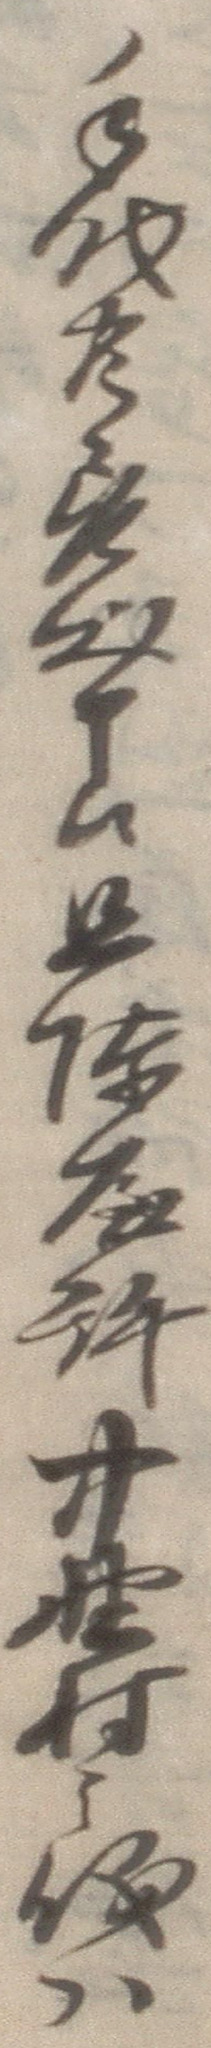手代共差出申候且陣屋許中野村之儀ハ
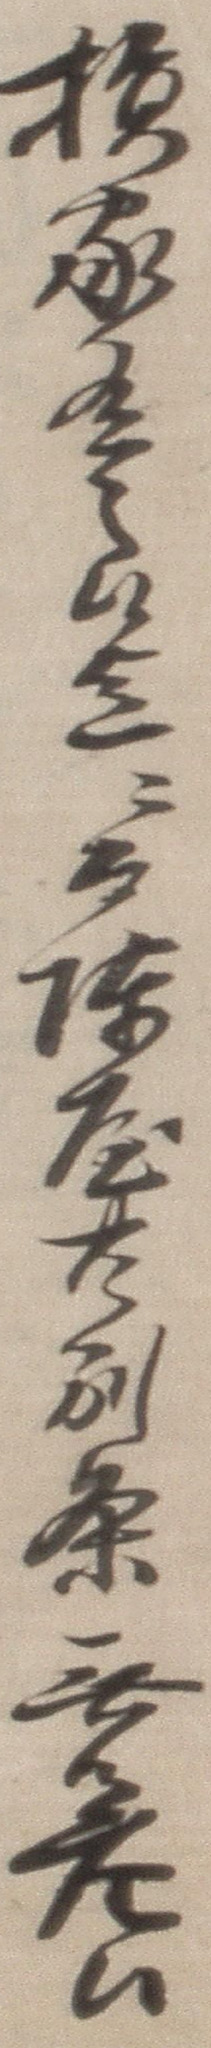損家有之候迄二而陣屋共別条無御座候
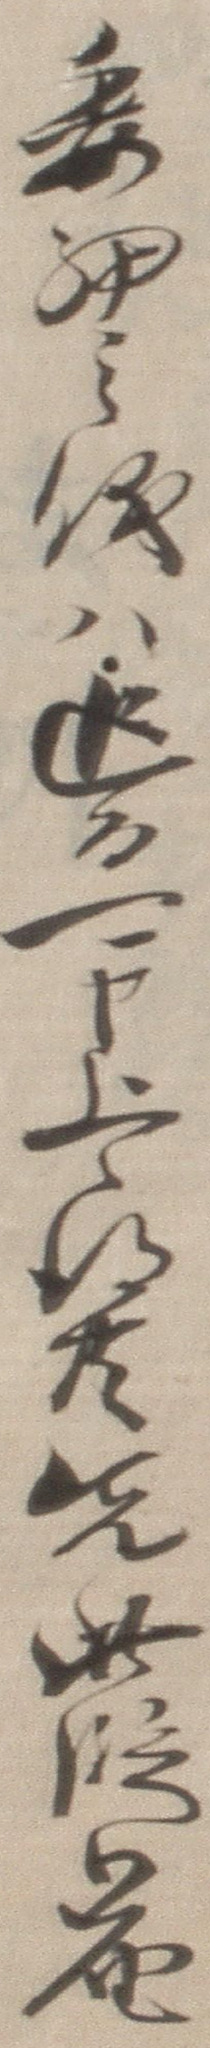委細之儀ハ追而可申上候得共先此段御届
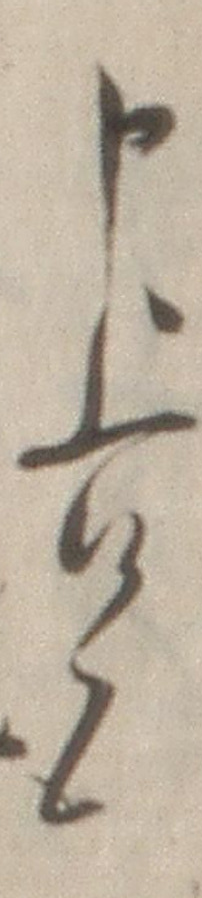申上候以上
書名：信州地震一件
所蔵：東京大学地震研究所図書室 Earthquake Research Institute Library, The University of Tokyo, JAPAN
